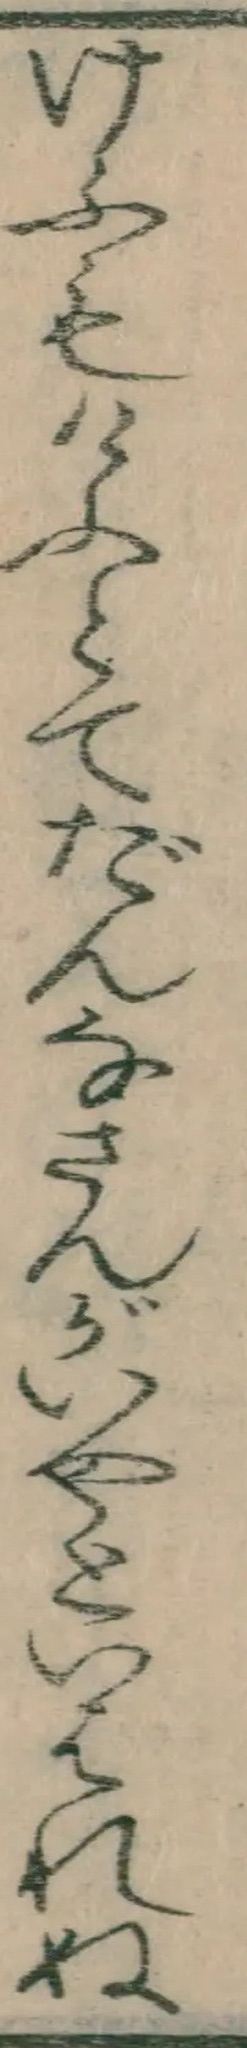けふもけふとてだんなさんがいやといはれぬ
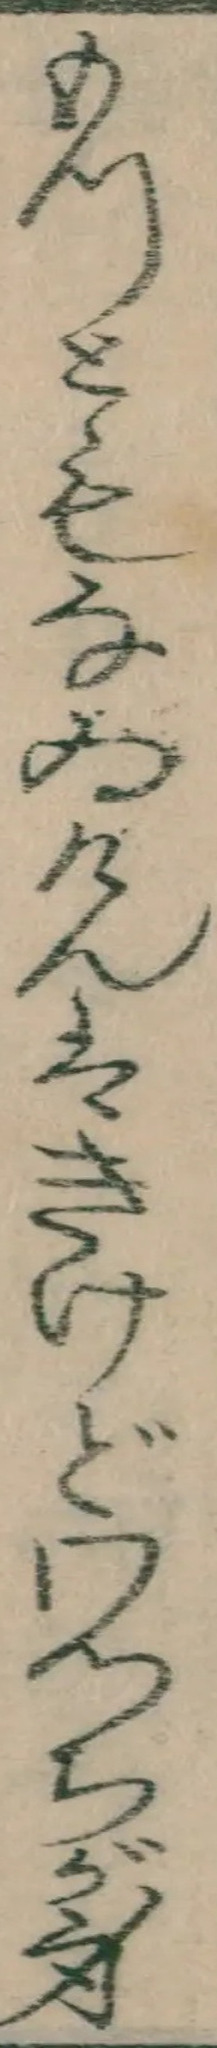もつともなゐけんはきけどわつちが身
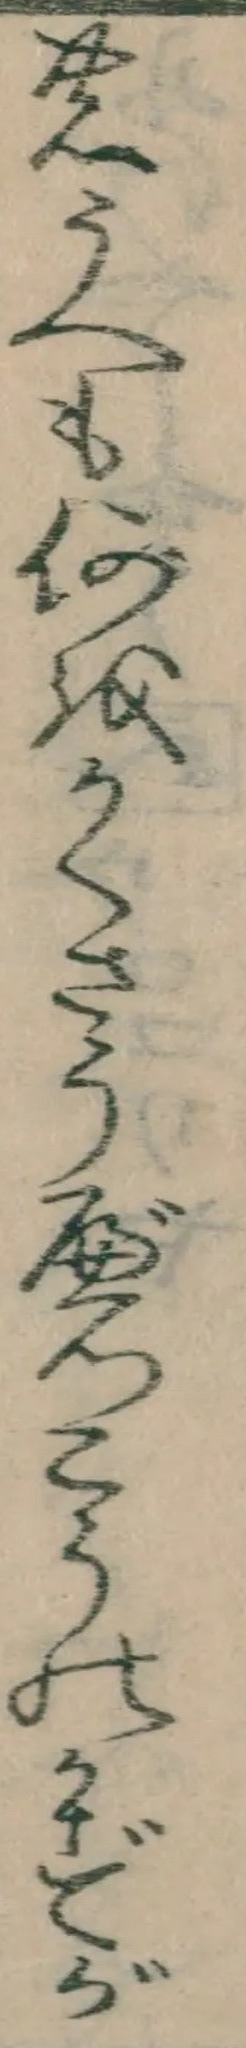のうへも何をかくさうべつこうのかずが
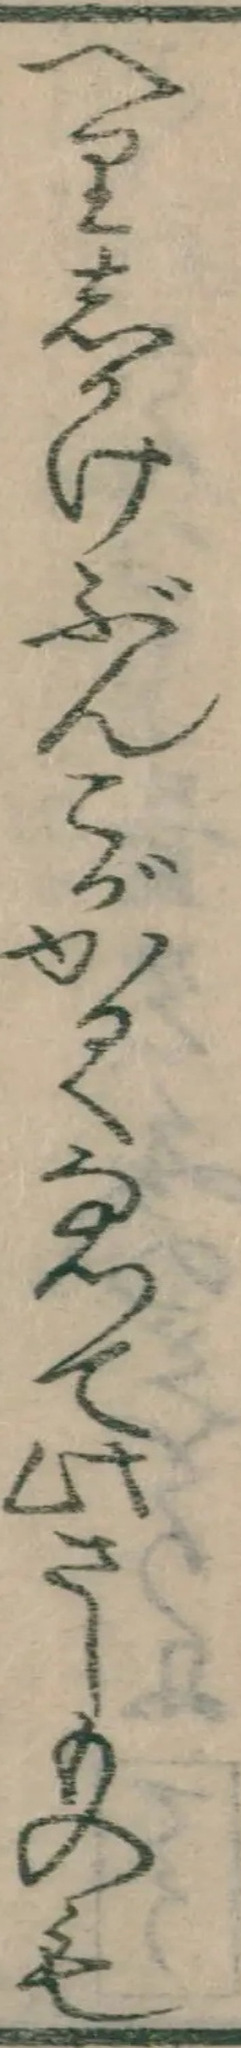へりしかけぶんこがかるくなつて此さしものも
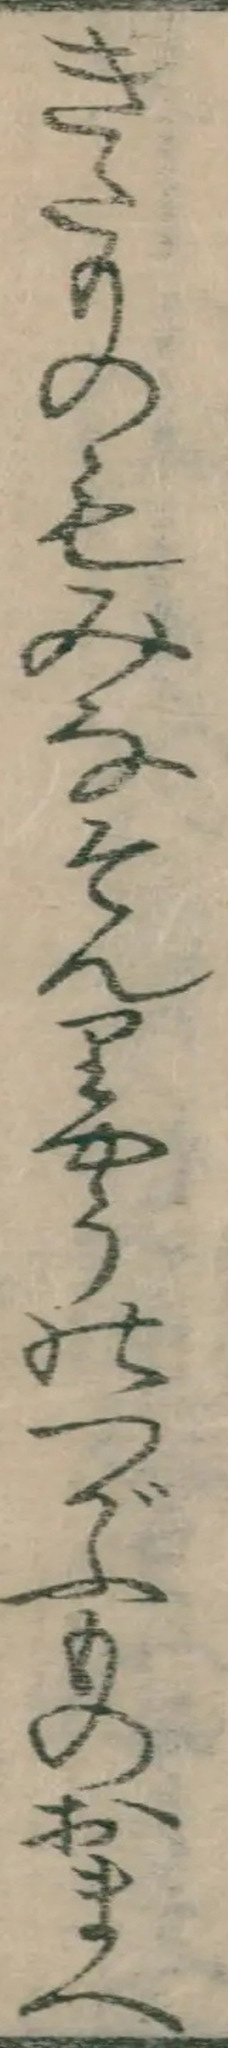きたものもみんなしんりやうのつがふものおまへ
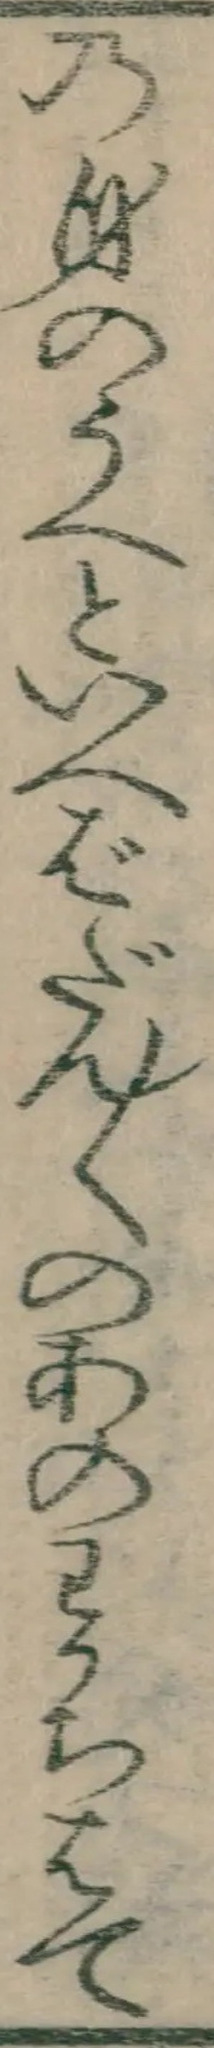の身のうへといへばだん〳〵のあのわかちはて

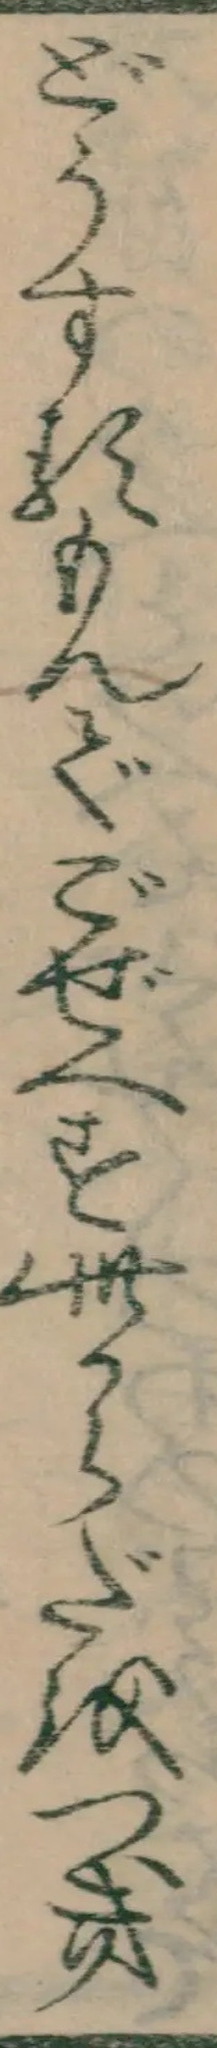そうあうえうもんでごぜへす此からだをつき
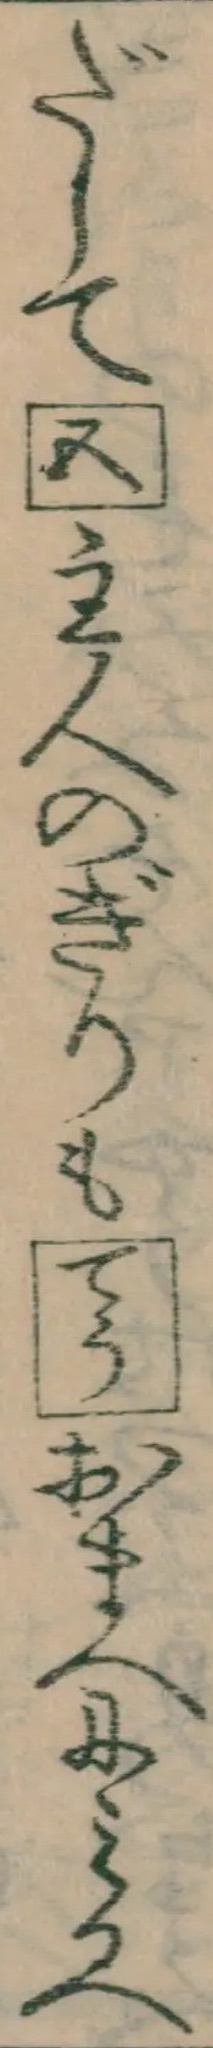だして〈五〉主人のぎりも〈てう〉おまへにみかへ
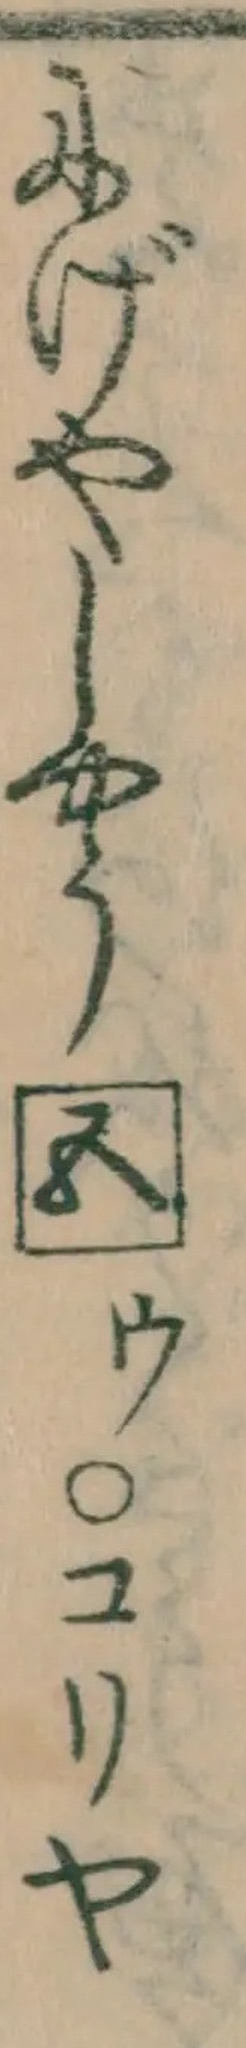にげやしやう〈五〉ウ○コリヤ
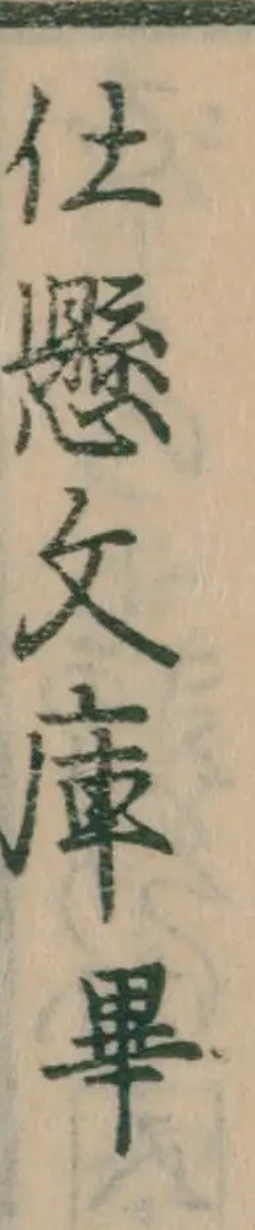仕懸文庫畢
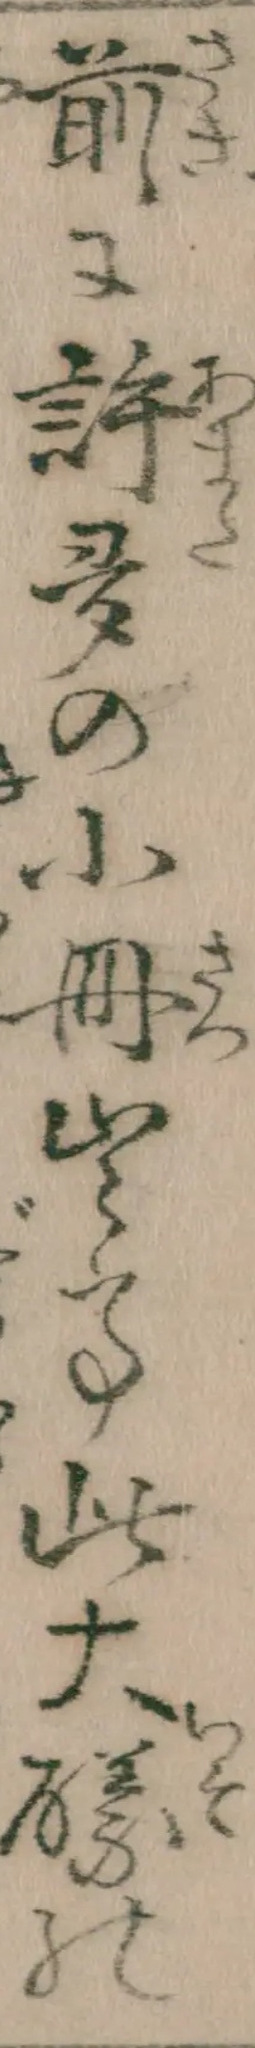前に許多の小冊出て此大磯の
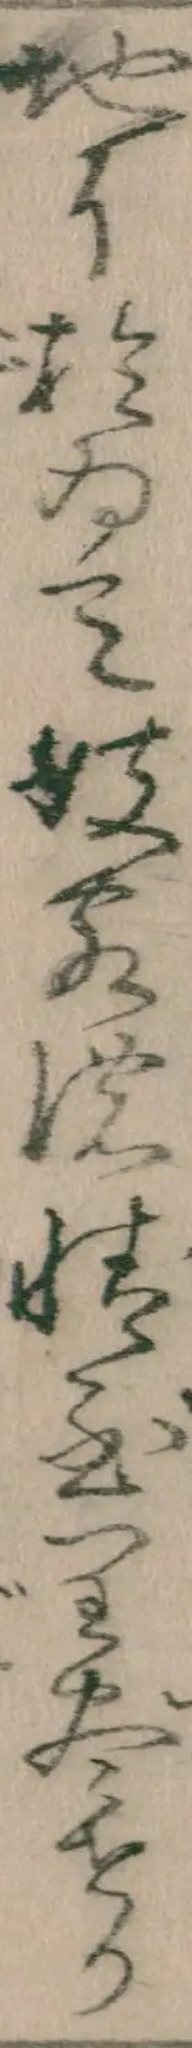地におゐて妓客の情至り尽せり
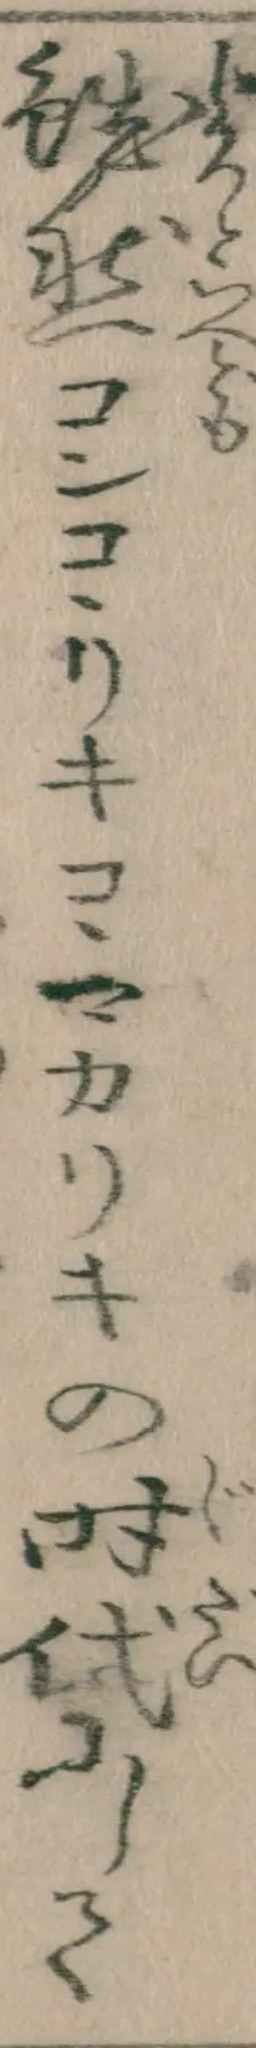雖然コンコヽリキコヽマカリキの時代にして
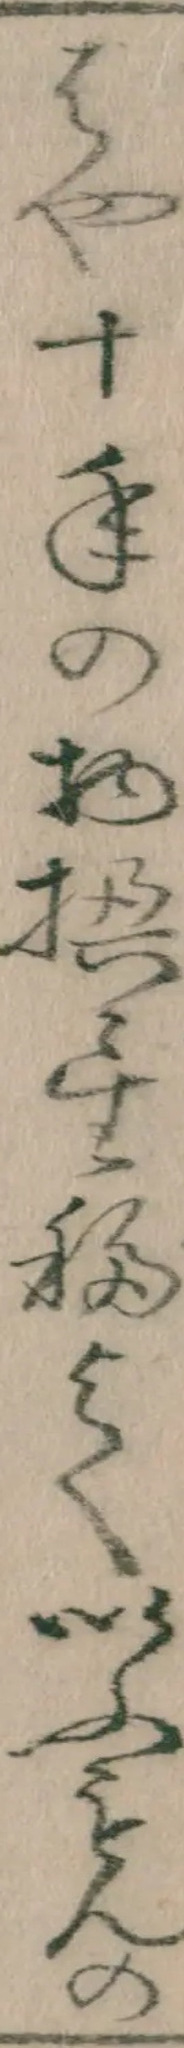はや十手の物換星移よくいふもんの
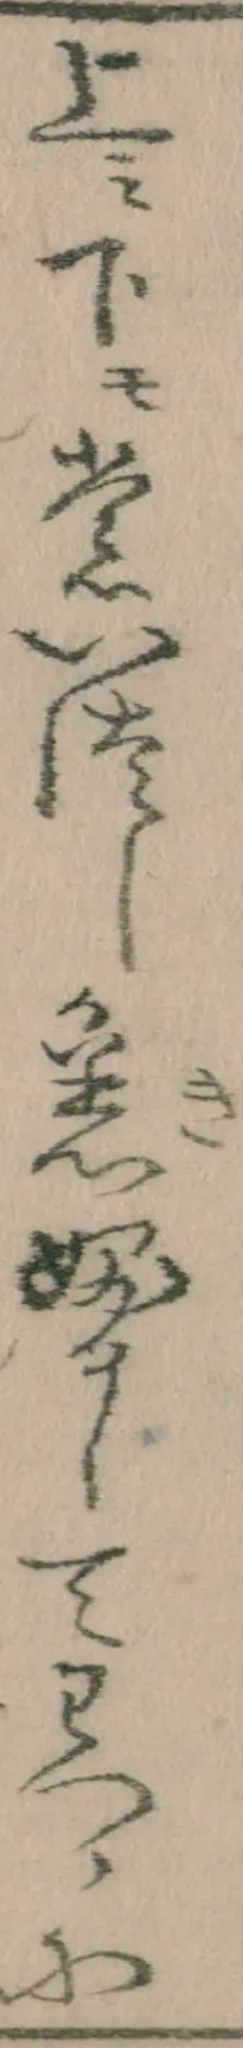上ミ下モもいつしか着ふるしてわつかに
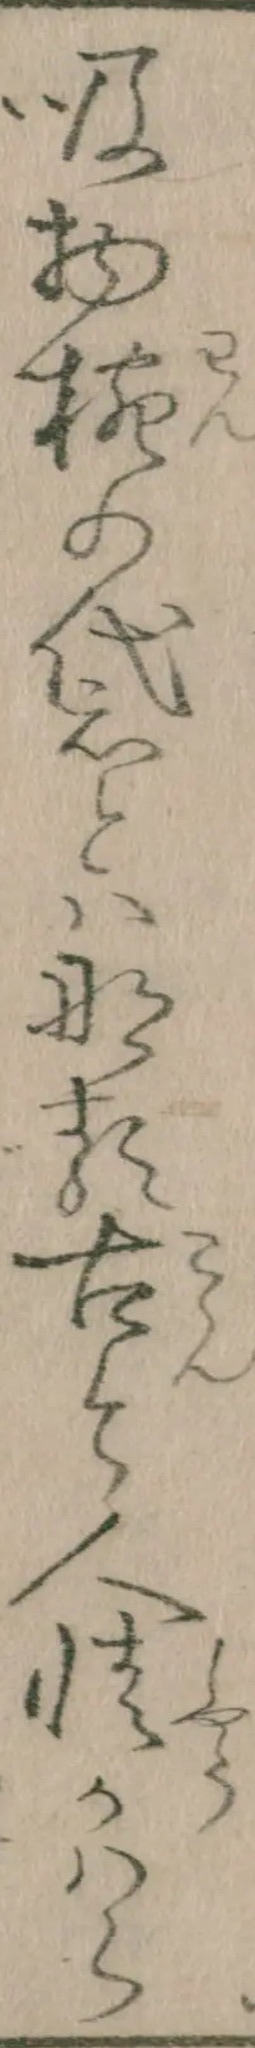吸物椀の袋とはなる古今人情かはら
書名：教訓読本：大礒風俗仕懸文庫
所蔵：国立国会図書館 National Diet Library, JAPAN
